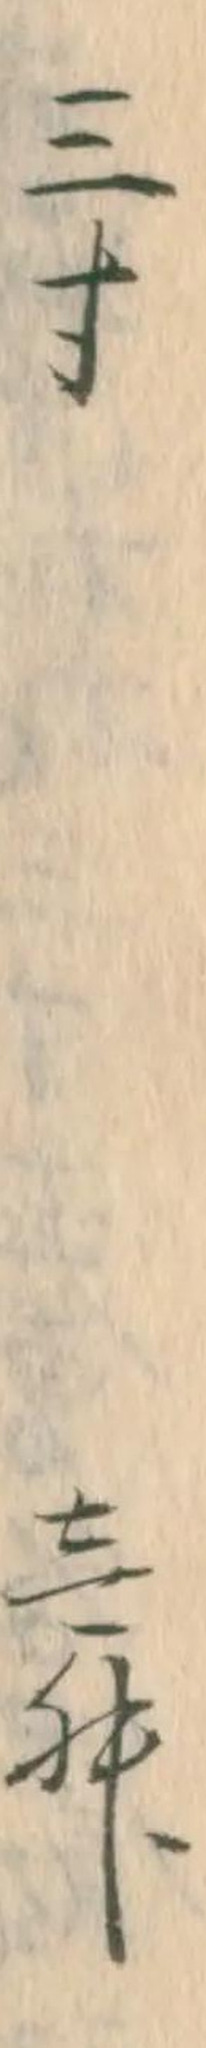三寸壱升
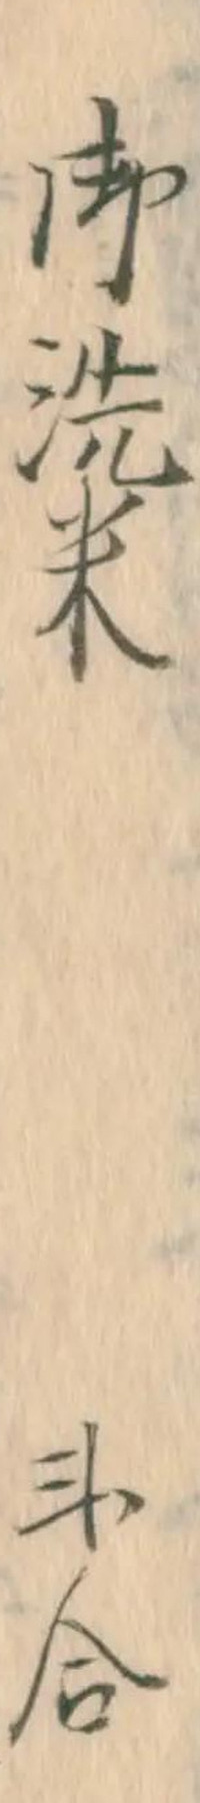御洗米弐合
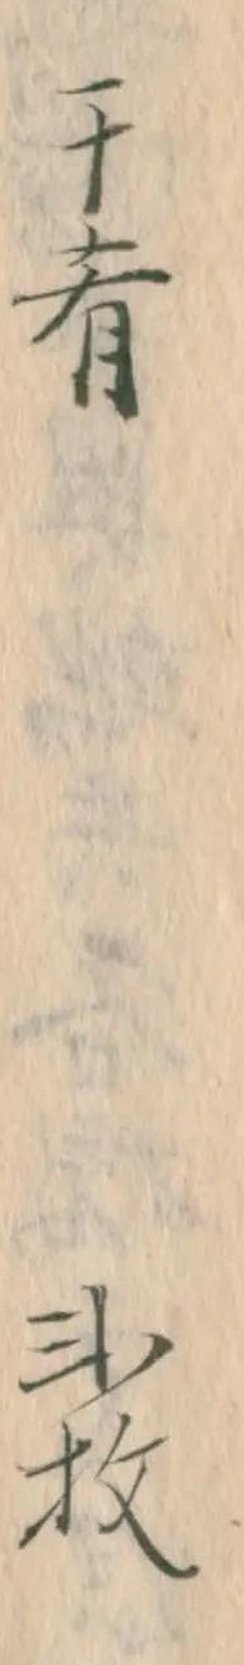干肴弐枚
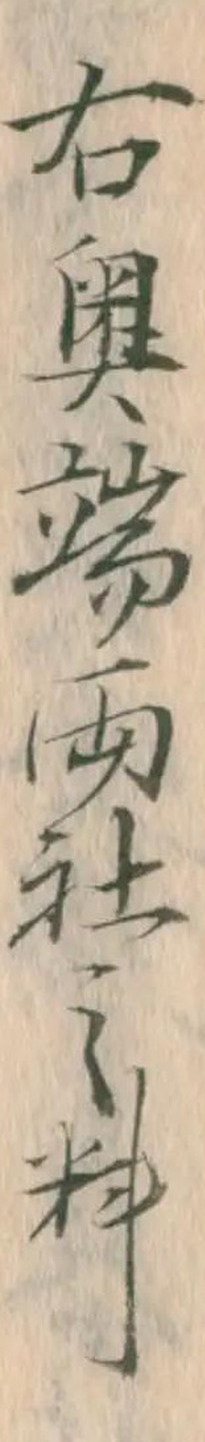右奥端両社之料
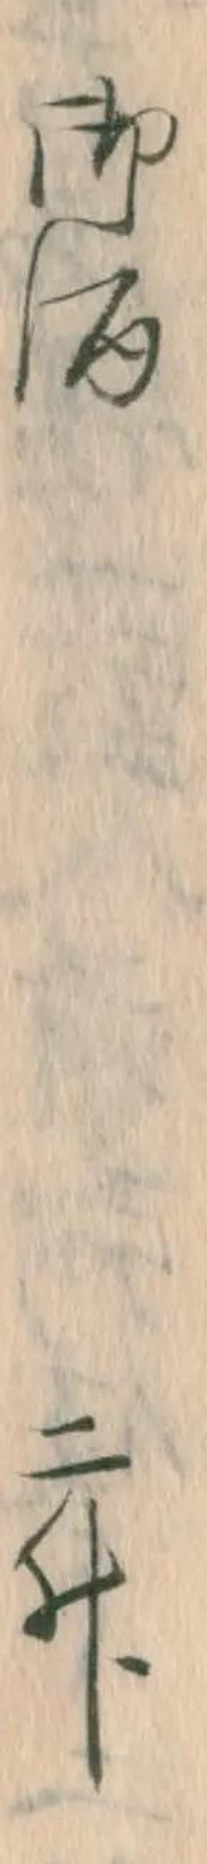御酒二升
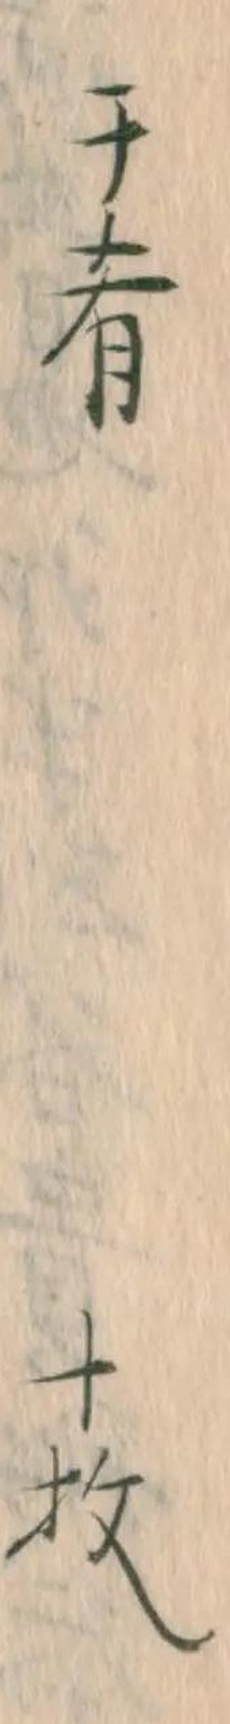干肴十枚
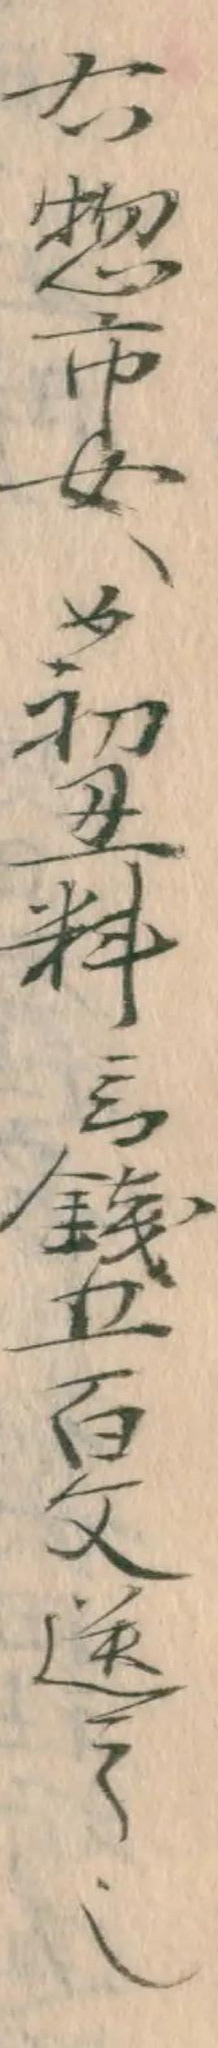右惣市女へ如初丑料ニ而銭五百文送之也
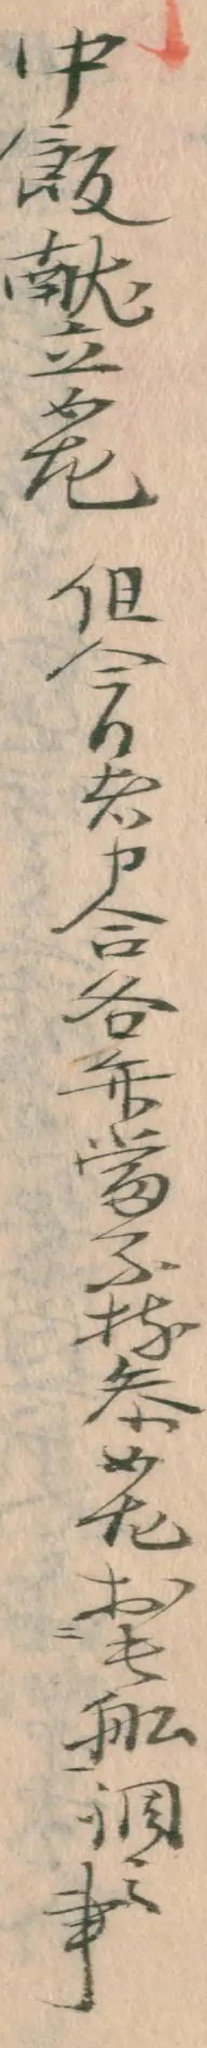中飯献立如左但今日者申合各弁當不持参如左於長舩調之事
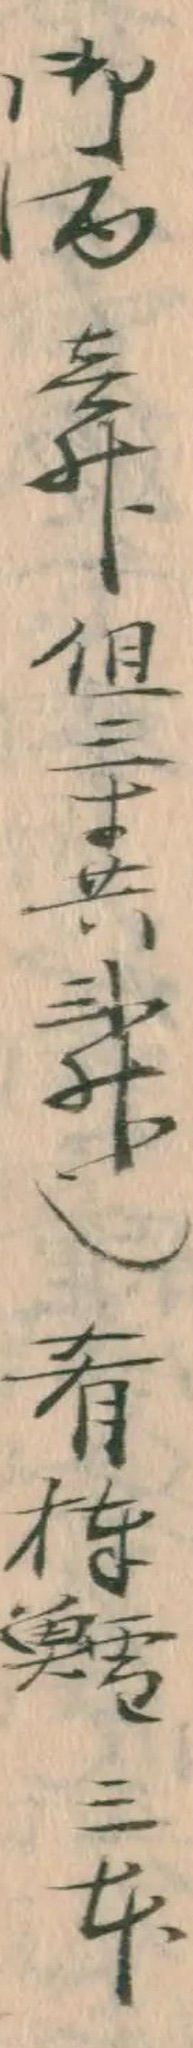御酒壱升但三寸共弐升也肴棒鱈三本
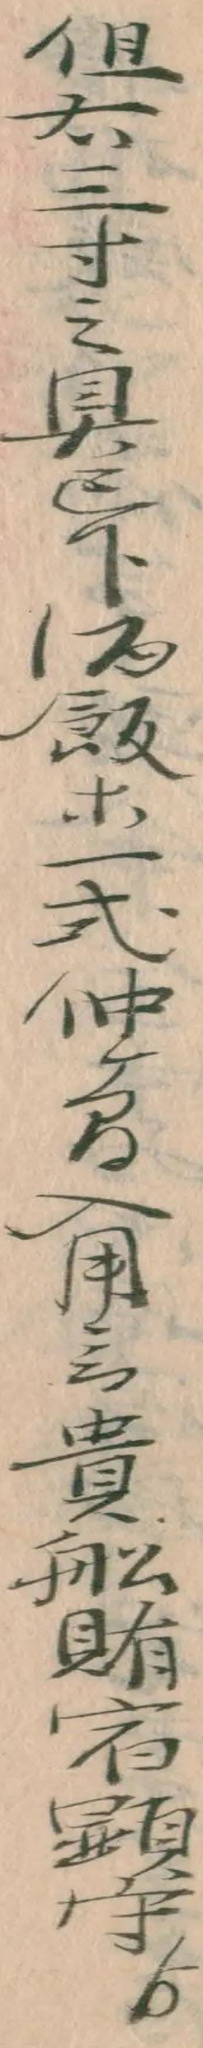但右三寸之具已下酒飯等一式仲ヶ間入用ニ而貴舩賄宿顕守ゟ
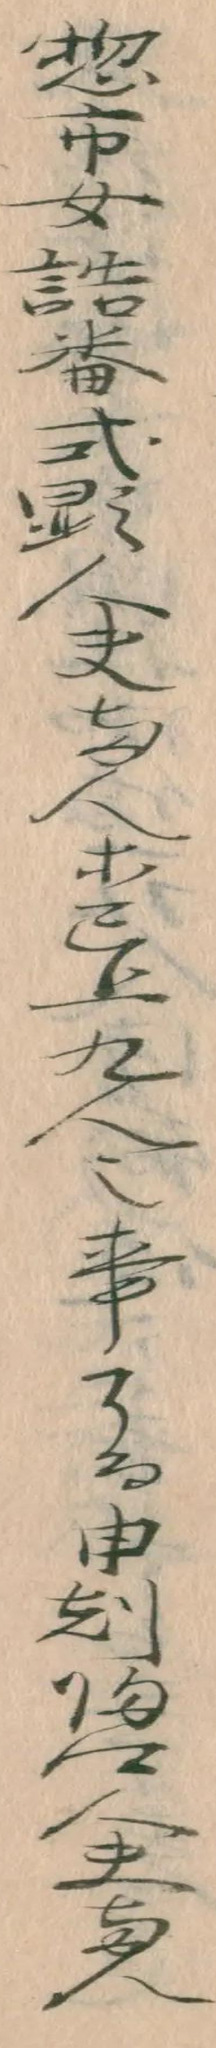惣市女詰番式顕人夫両人等已上九人也事了而申刻帰郷人夫両人
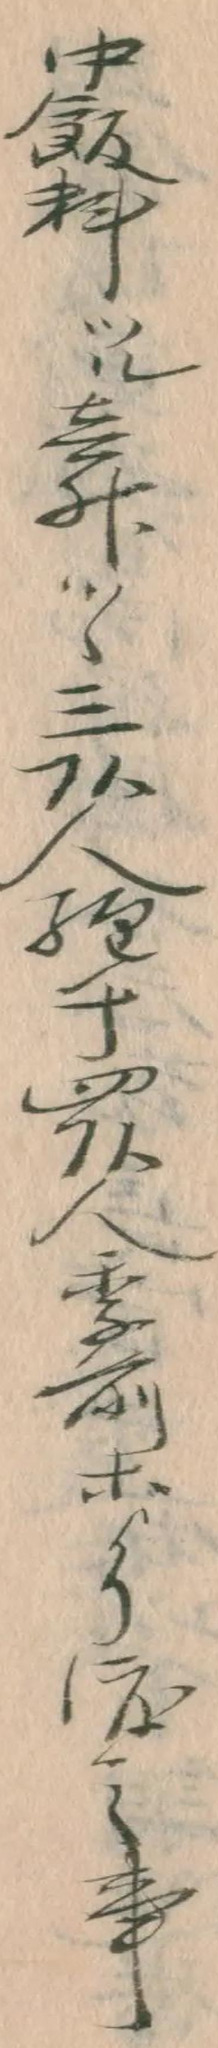中飯料ツル壱升ツヽ三頭人経千四頭人季前等より渡之事
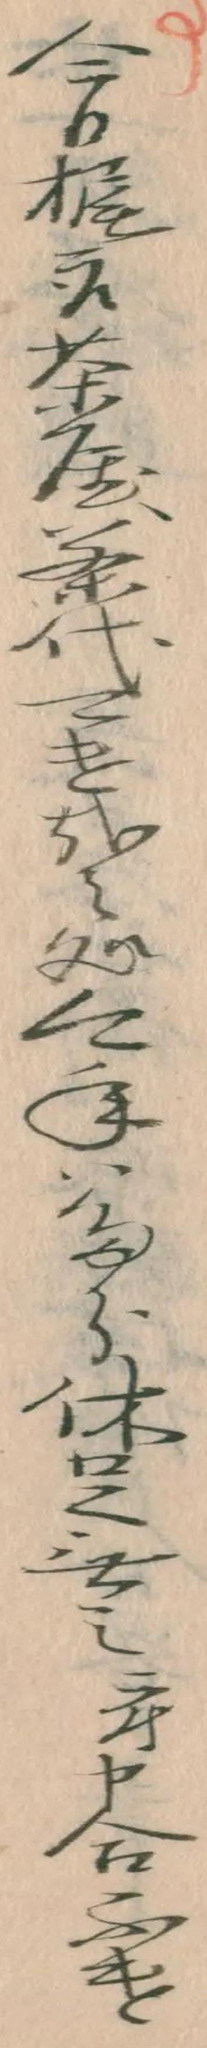今日梶取茶屋ヘ茶代可遣哉之処今年ハ多分休足無之ニ付申合不遣
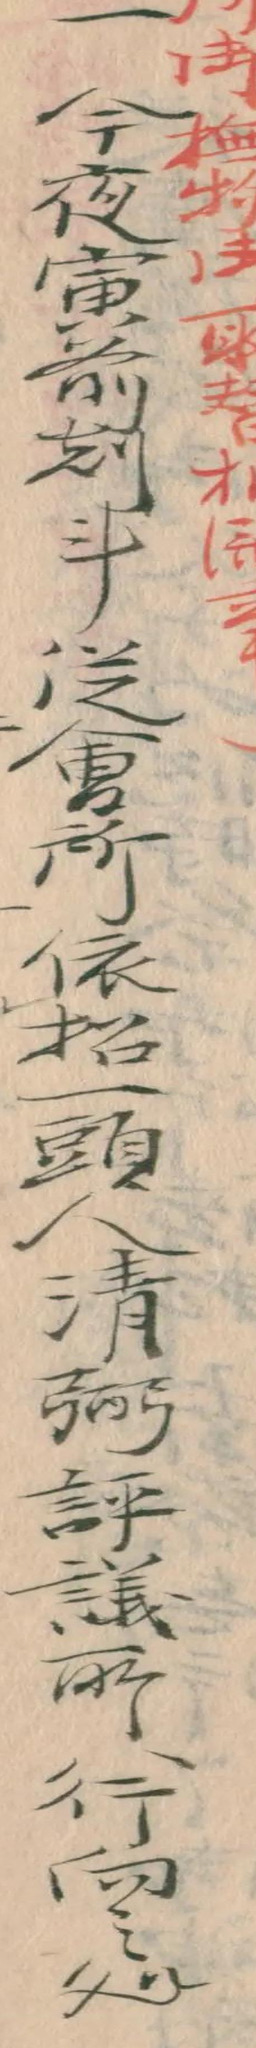一今夜寅前刻斗従會所依招一頭人清弼評議所ヘ行向之処
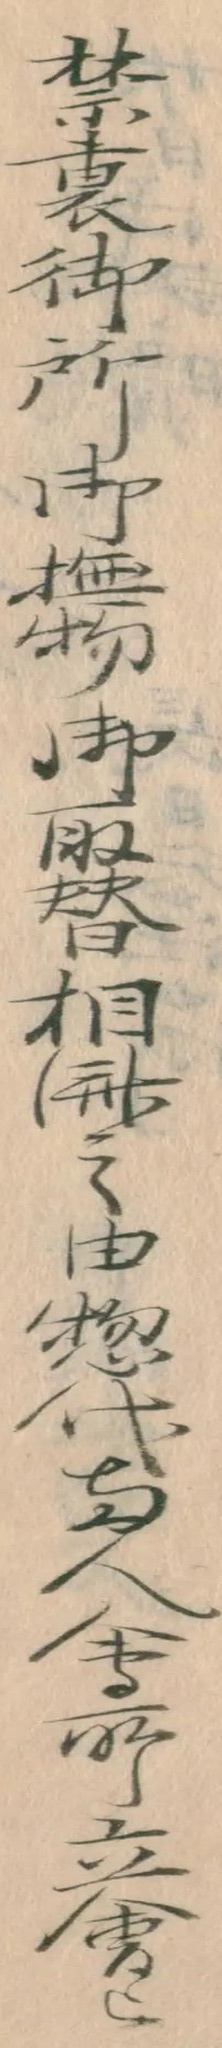禁裏御所御撫物御取替相済之由惣代両人會所立會被
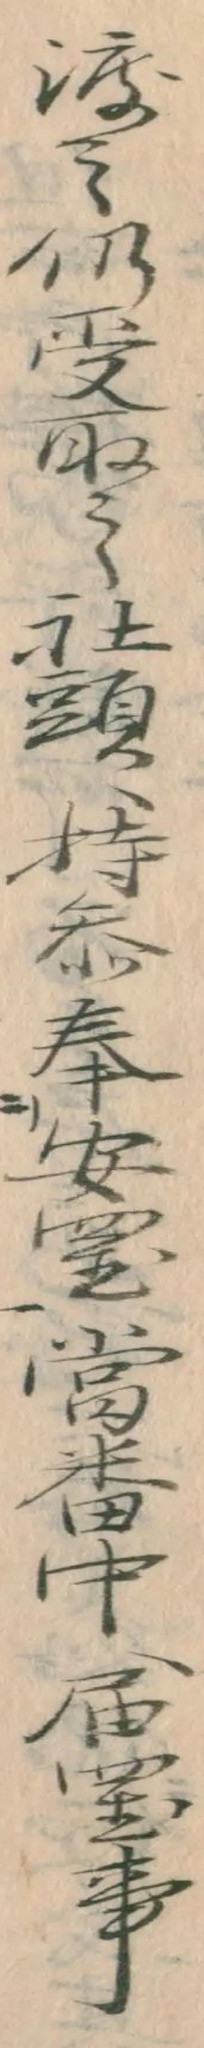渡之仍受取之社頭へ持参奉安置當番中へ届置事
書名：賀茂社記録. 第74冊
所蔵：国立国会図書館 National Diet Library, JAPAN
